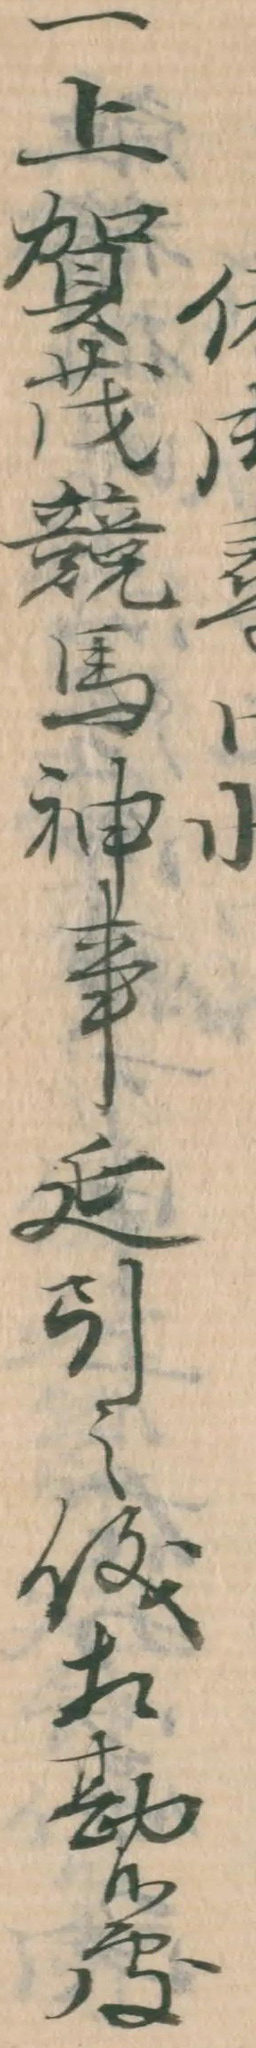一上賀茂競馬神事延引之儀相勘候処
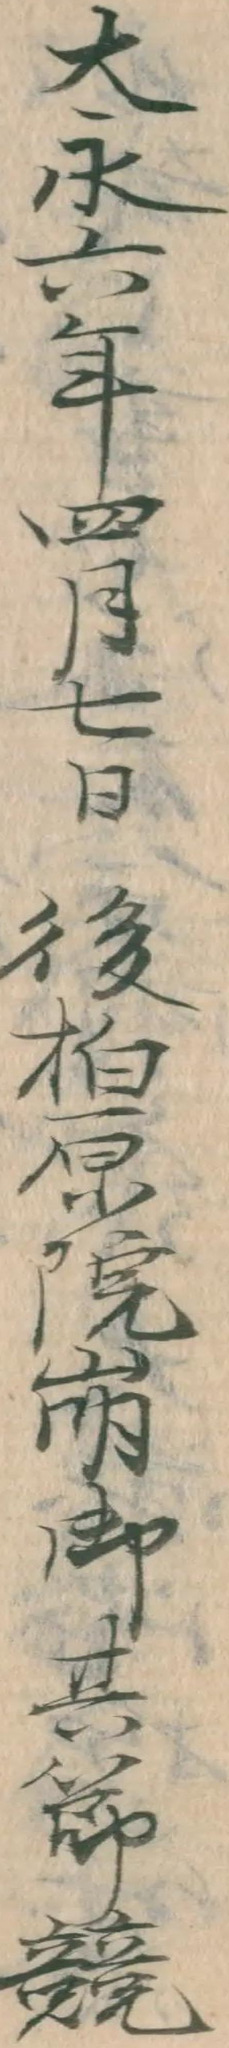大永六年四月七日後柏原院崩御其節競
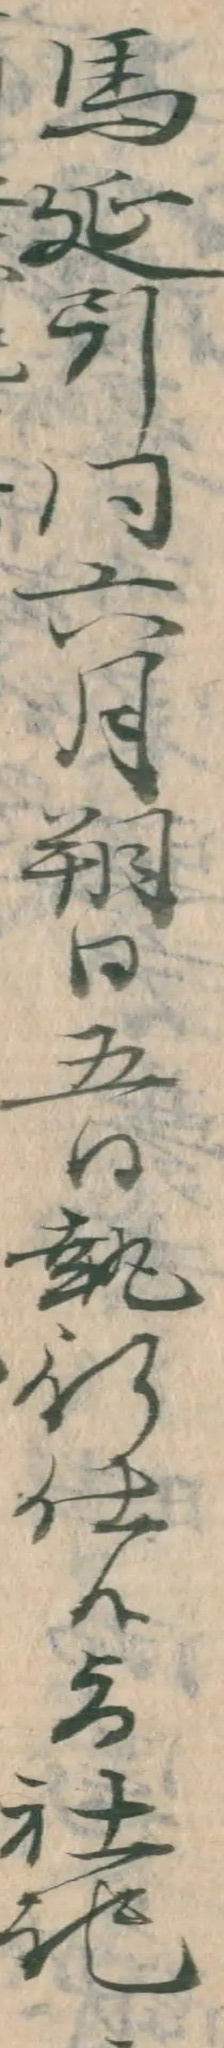馬延引同六月朔日五日執行仕候旨社記ニ
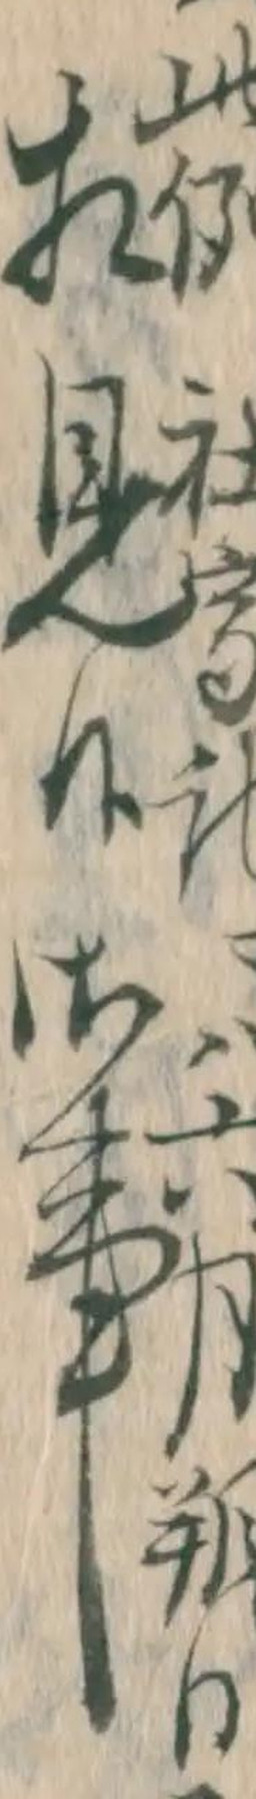相見候御事
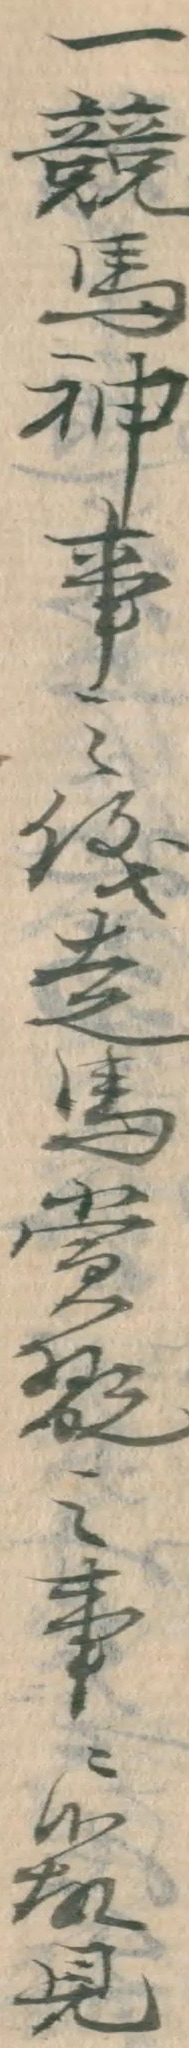一競馬神事之儀走馬賞翫之事ニ候故見
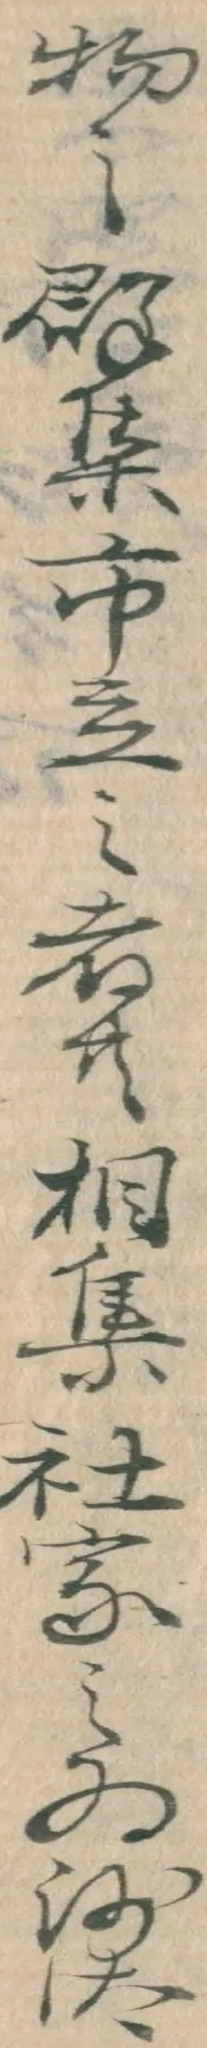物之群集市立之者共相集社家之為沙汰
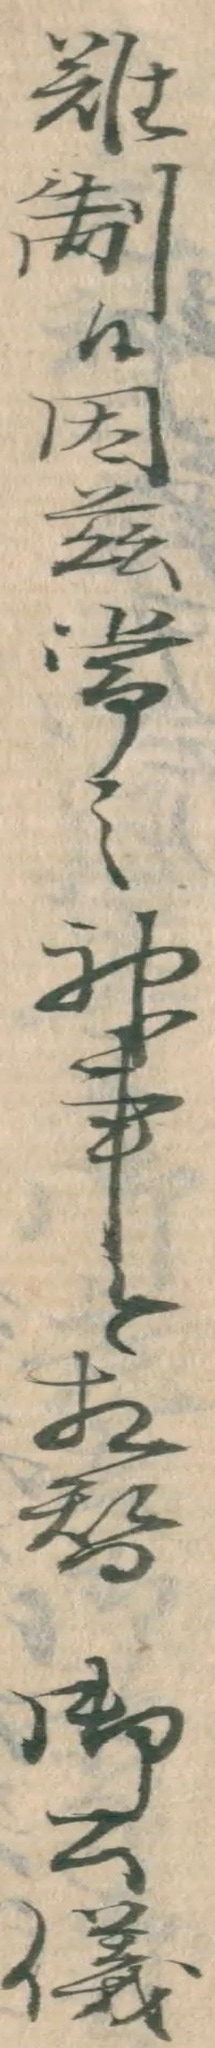難制候因茲常之神事と相替御公儀
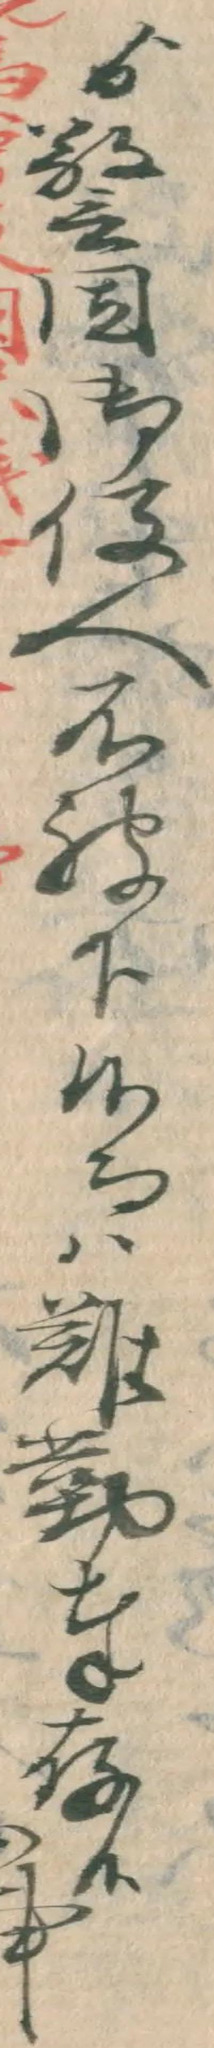ゟ警固御役人不被下候而ハ難勤奉存候御事
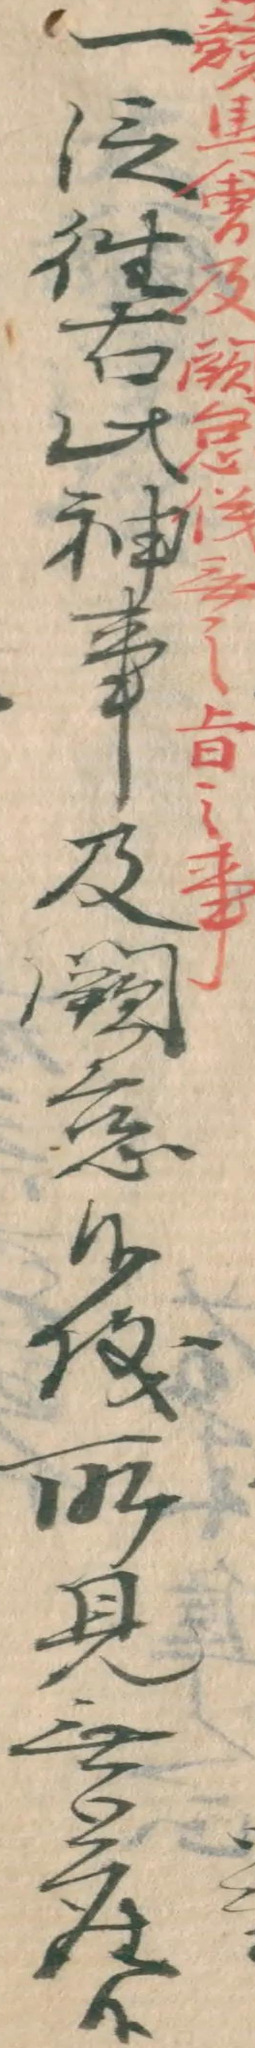一従往古此神事及闕怠候儀所見無御座候
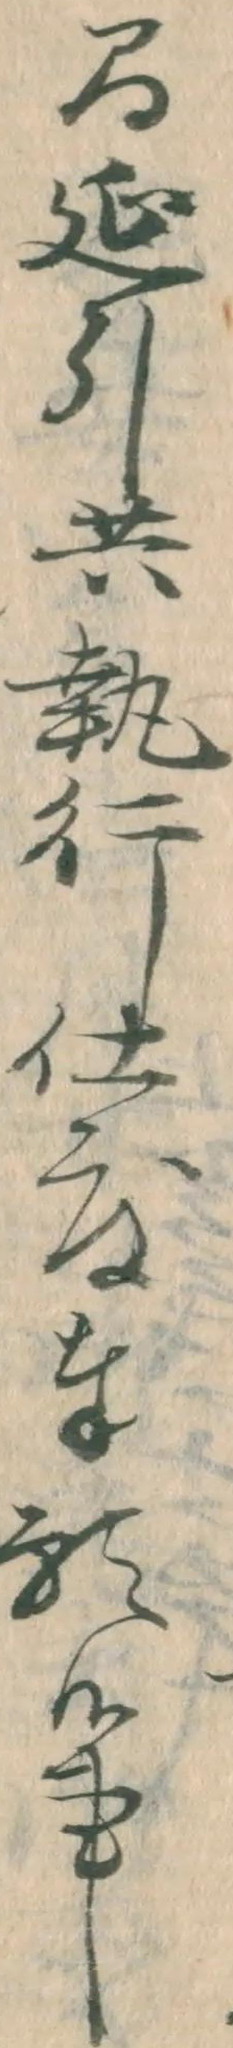間延引共執行仕度奉願候事
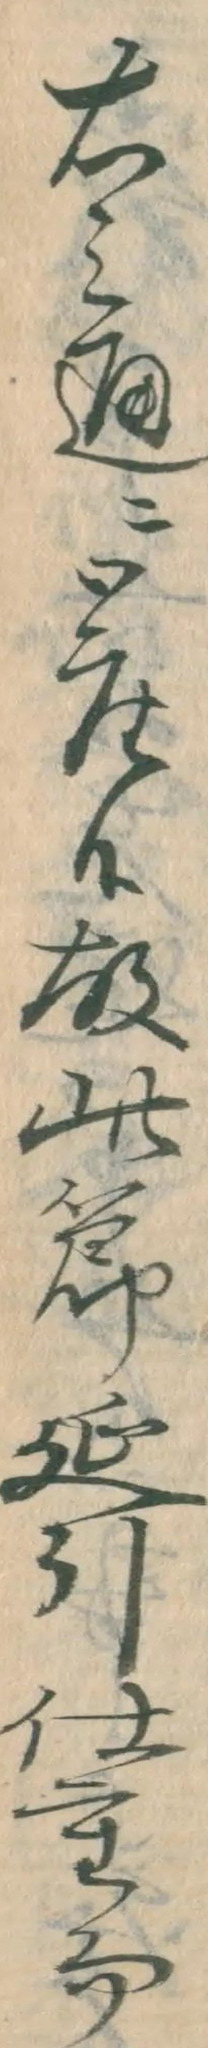右之通ニ御座候故此節延引仕重而

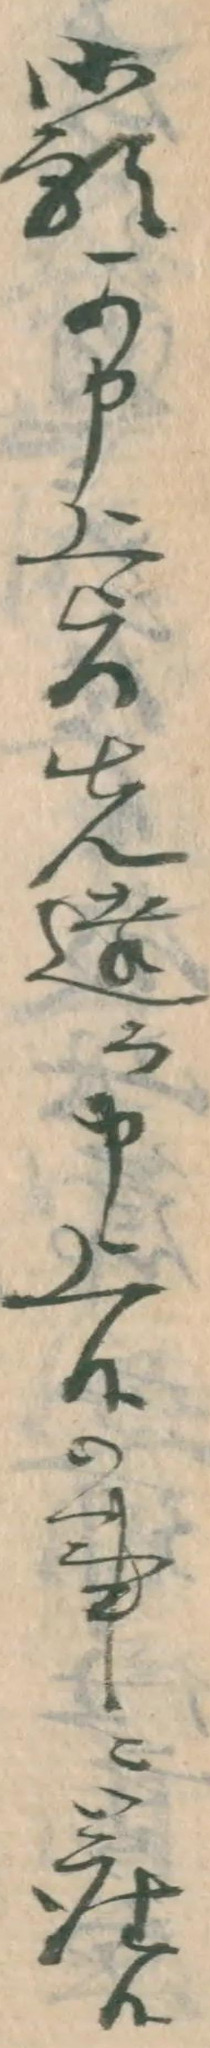御願可申上旨先達而申上候御事ニ御座候
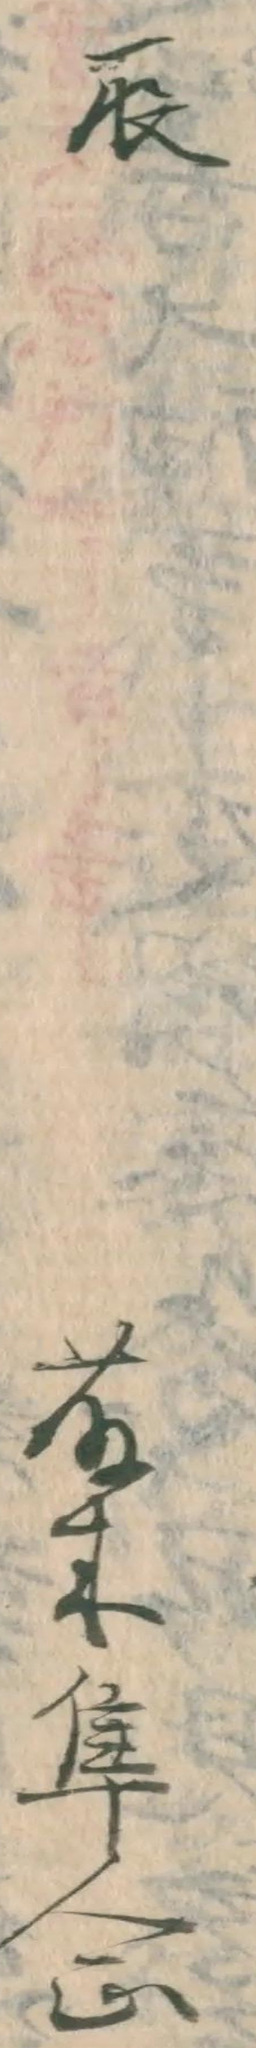辰藤木隼人正
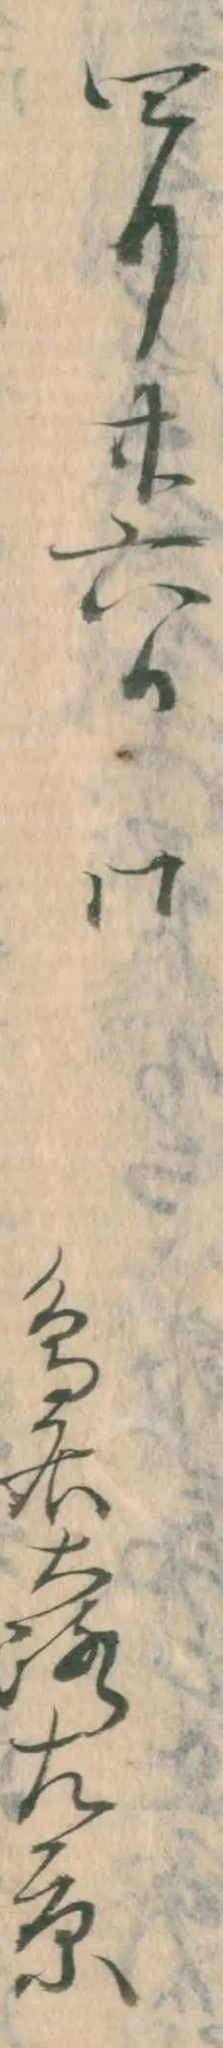四月廿六日同鳥居大路左京
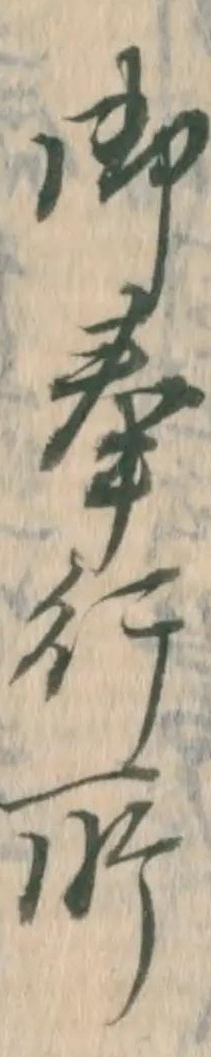御奉行所
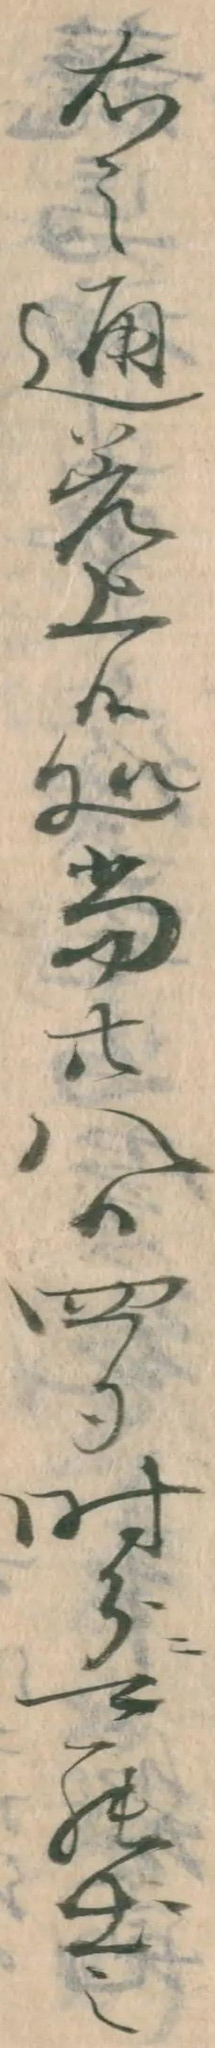右之通差上候処当二十八日四ツ時分ニ可罷出之
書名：賀茂社記録. 第10冊
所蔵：国立国会図書館 National Diet Library, JAPAN
